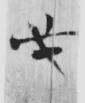弋
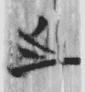之
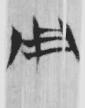用
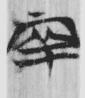兩
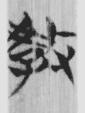教
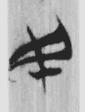民
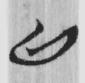㠯（以）
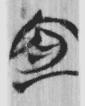宜
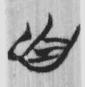頁
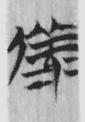備
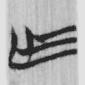乍
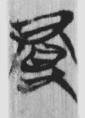曼
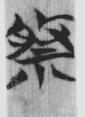祭
